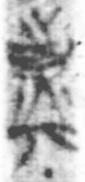真
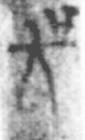吳
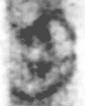甲
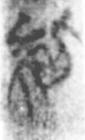紫
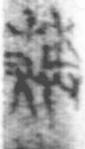○（縢）
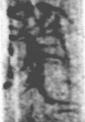騬
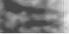二
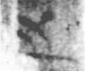之
